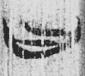曰
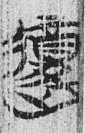復
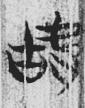{古欠}（苦）
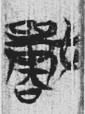戰
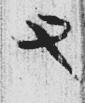又
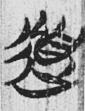道
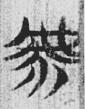{虍介}（乎）
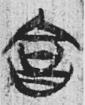合
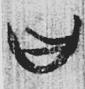曰
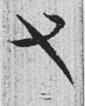又
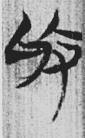收
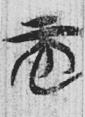而
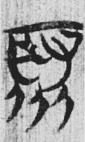聚
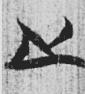之
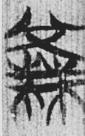○（束）
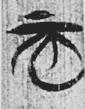而
